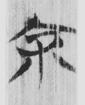余
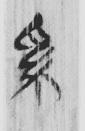奚
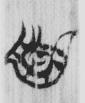面
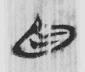目
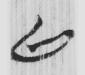㠯（以）
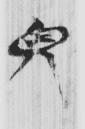{目人}
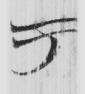于
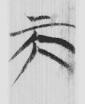天
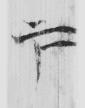下
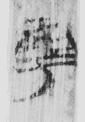𩁹
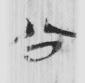公
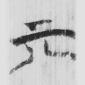亓
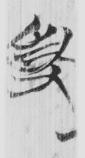事
